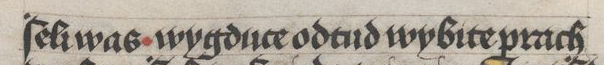ẛeli was.wygduce odtud wybíte prach
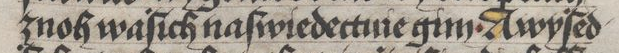z noh waẛích na ſwiedectuie gim.A wyẛed¬
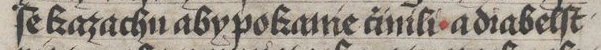ẛe kazachu aby pokanie ċinili.a diabelſt¬
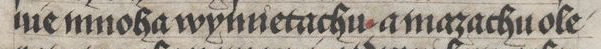uíe mnoha wymietachu.a mazachu ole¬
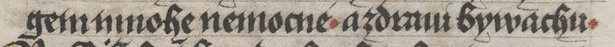gem mnohé nemocné.a zdraui bywachu
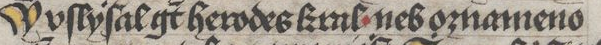Y vſlyẛal ḡt herodes kral.neb oznameno¬
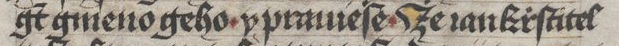ḡt gmeno geho.y prauíeẛe.Że ian kṙſtitel
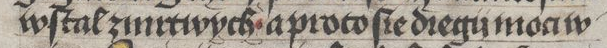wſtal zmrtwych.a proto ſie diegij moci w
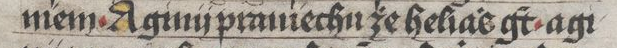mém.A ginij prauíechu.że heliaṡ ḡt.a gi¬
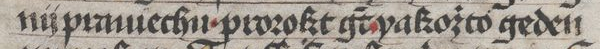nij prauiechu.prokokt ḡt yakożto geden
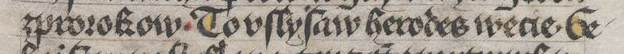zprorokow.To vſlyẛaw herodes wecie.Ge¬
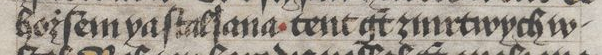hoż ſem ya ſtal Iana.tent ḡt z mrtwych w¬
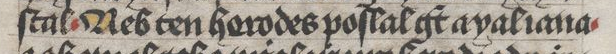ſtal.Neb ten herodes poſlal ḡt ay yal iana
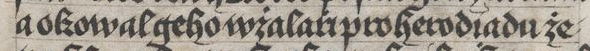a okowal geho wżalaṙi pro herodiadu że¬
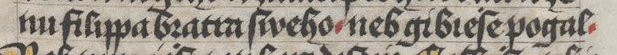nu filippa bratra ſweho.neb gi bieẛe pogal.
